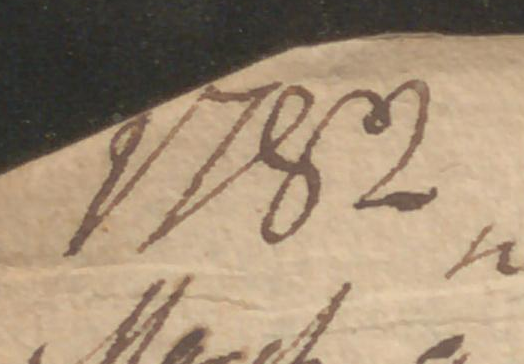1782
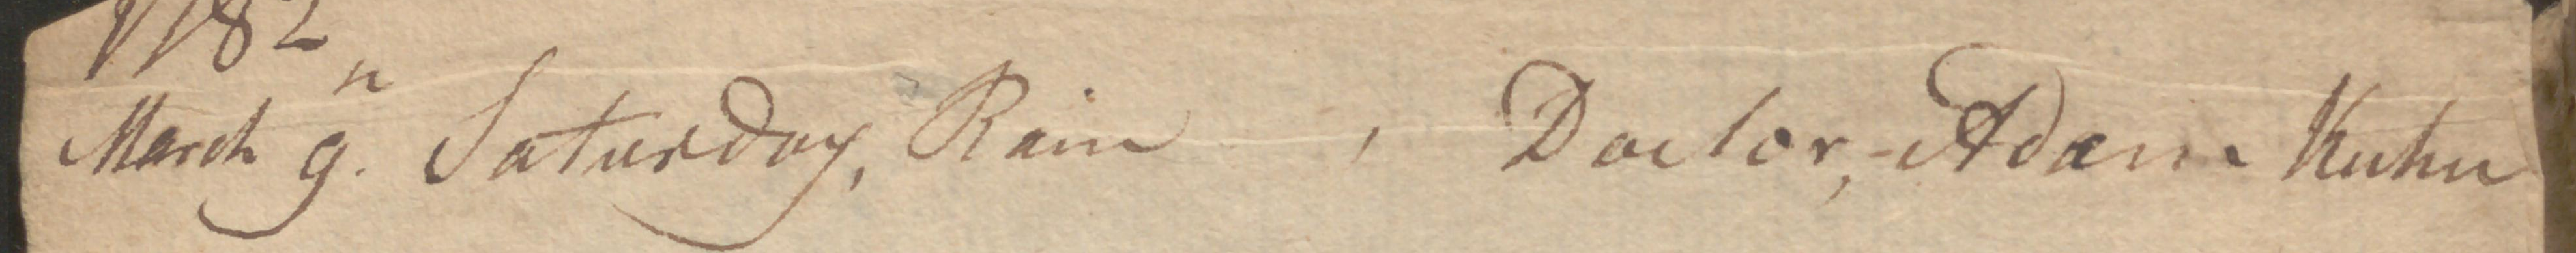March 9^th. Saturday, Rain. Doctor Adam Kuhn
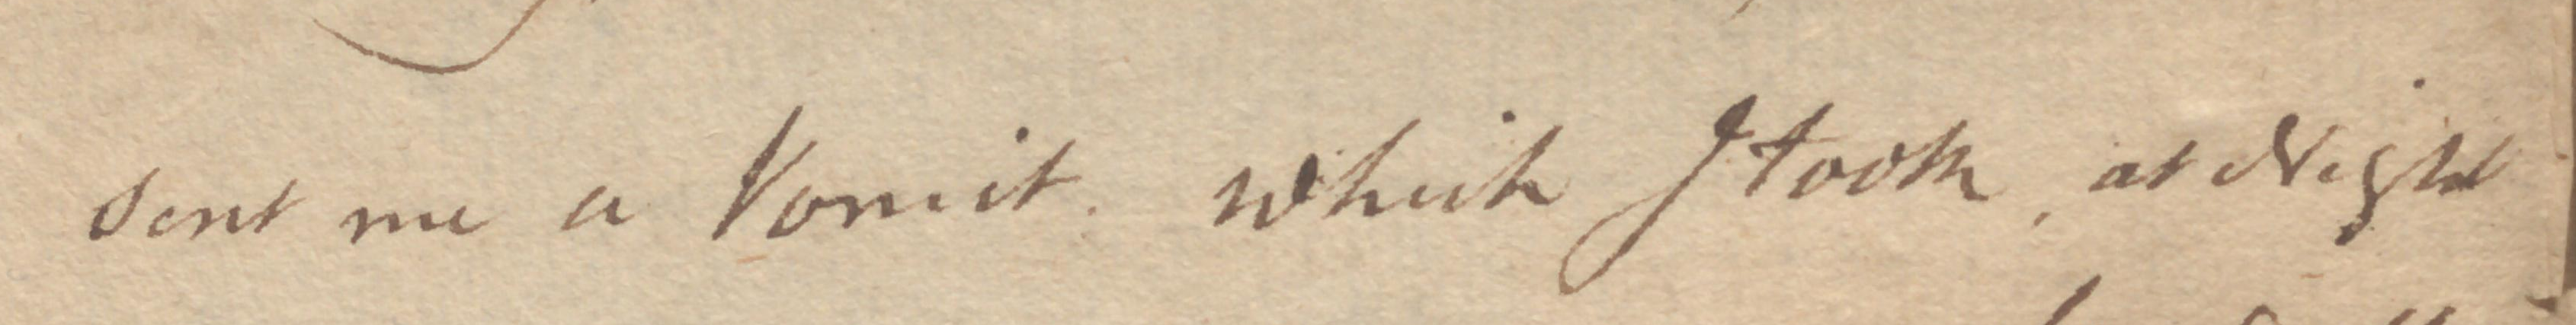sent me a Vomit which I took at Night
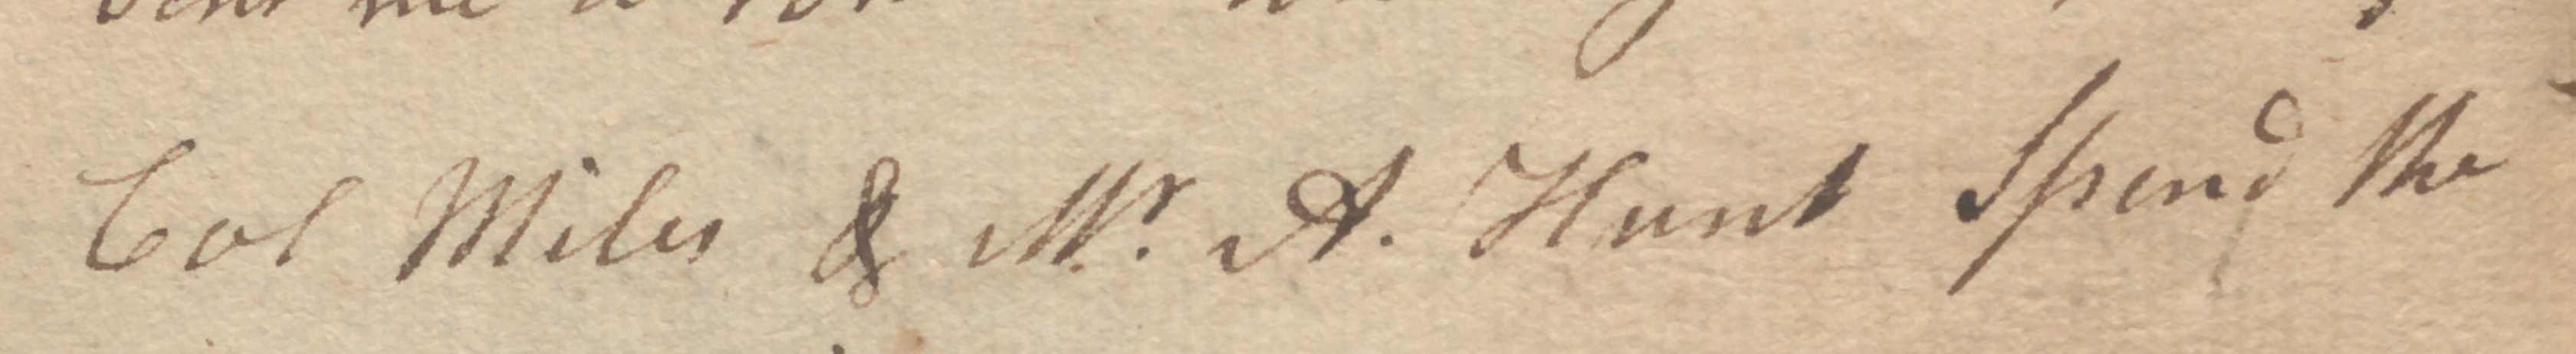Col Miles & M^r. A. Hunt spend the
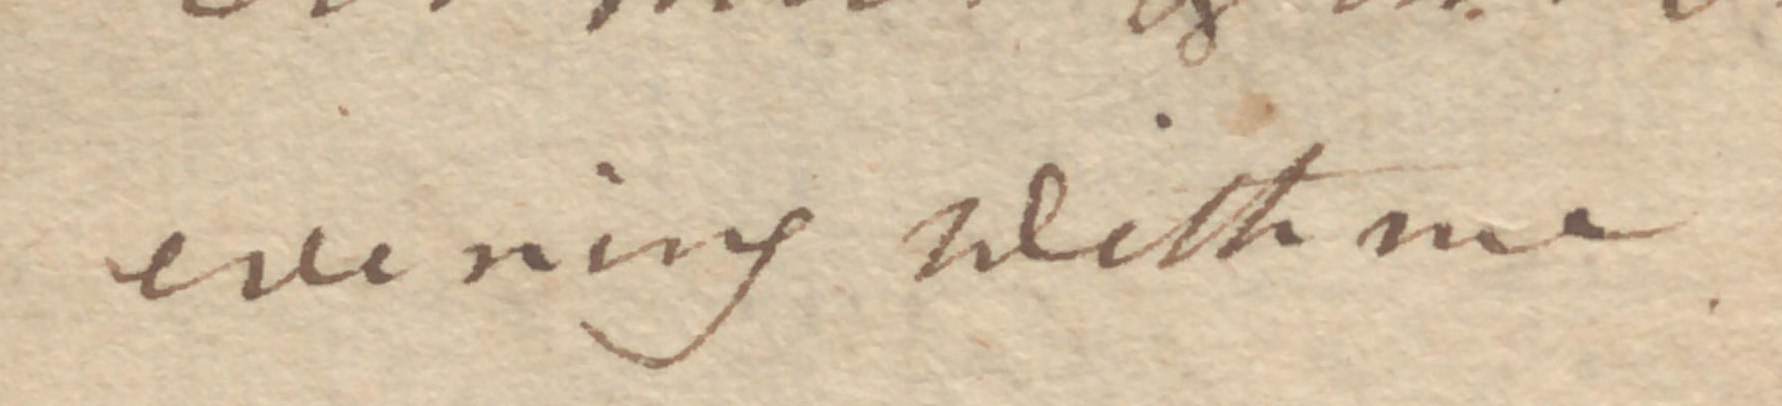evening with me
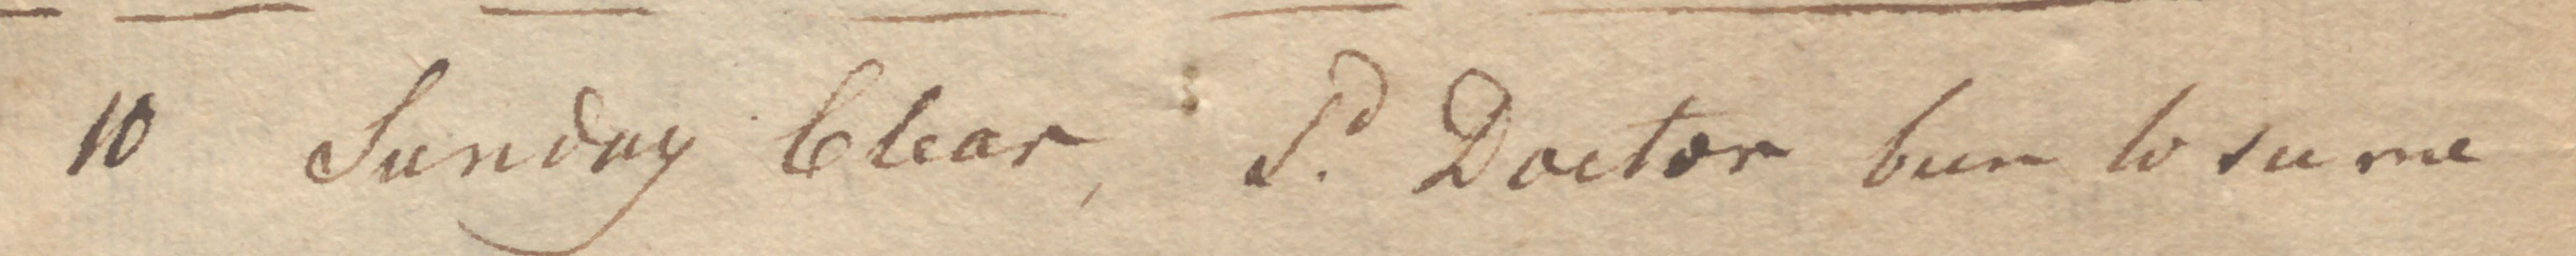10 Sunday Clear, s^d. Doctor been to see me
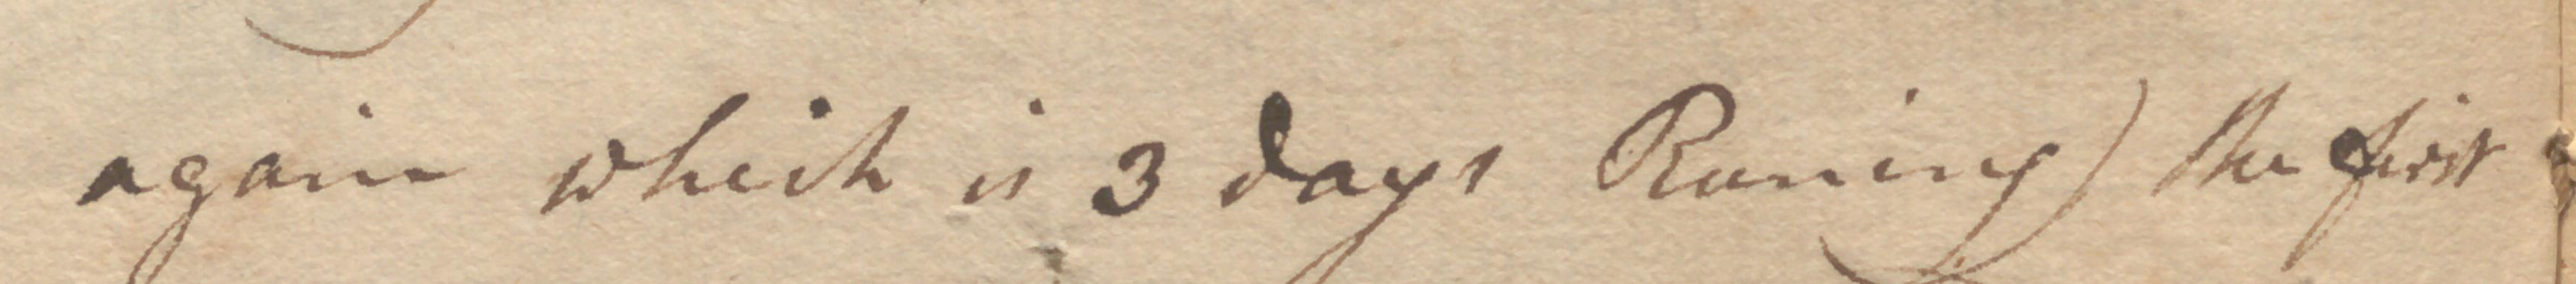again which is 3 days Runing) the first
